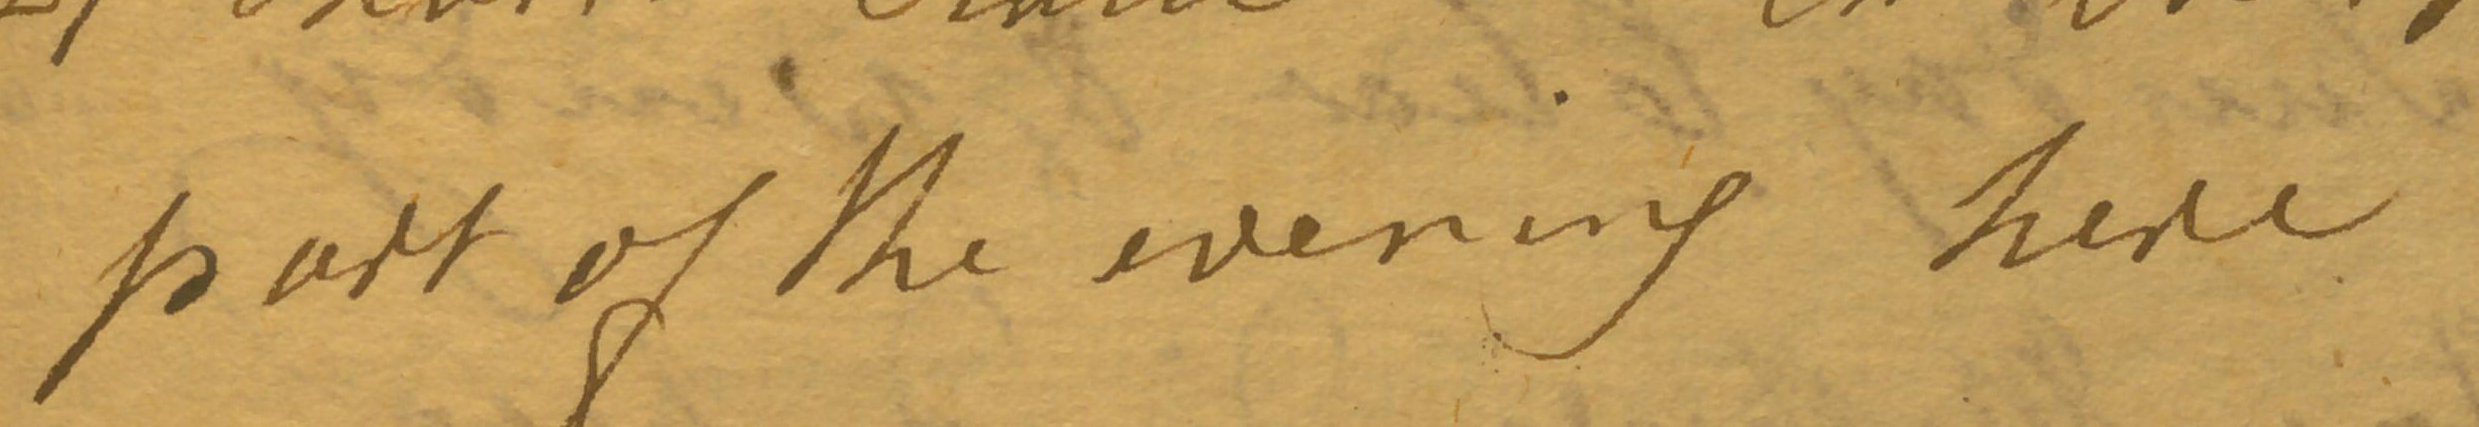part of the evening here
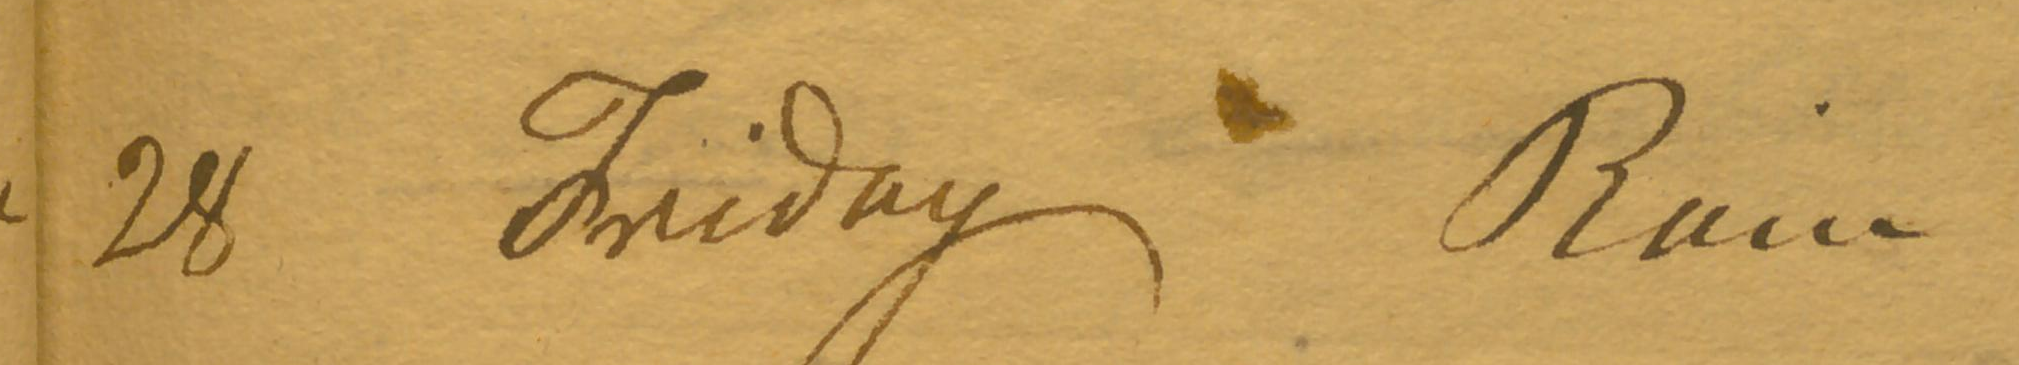28 Freiday Rain
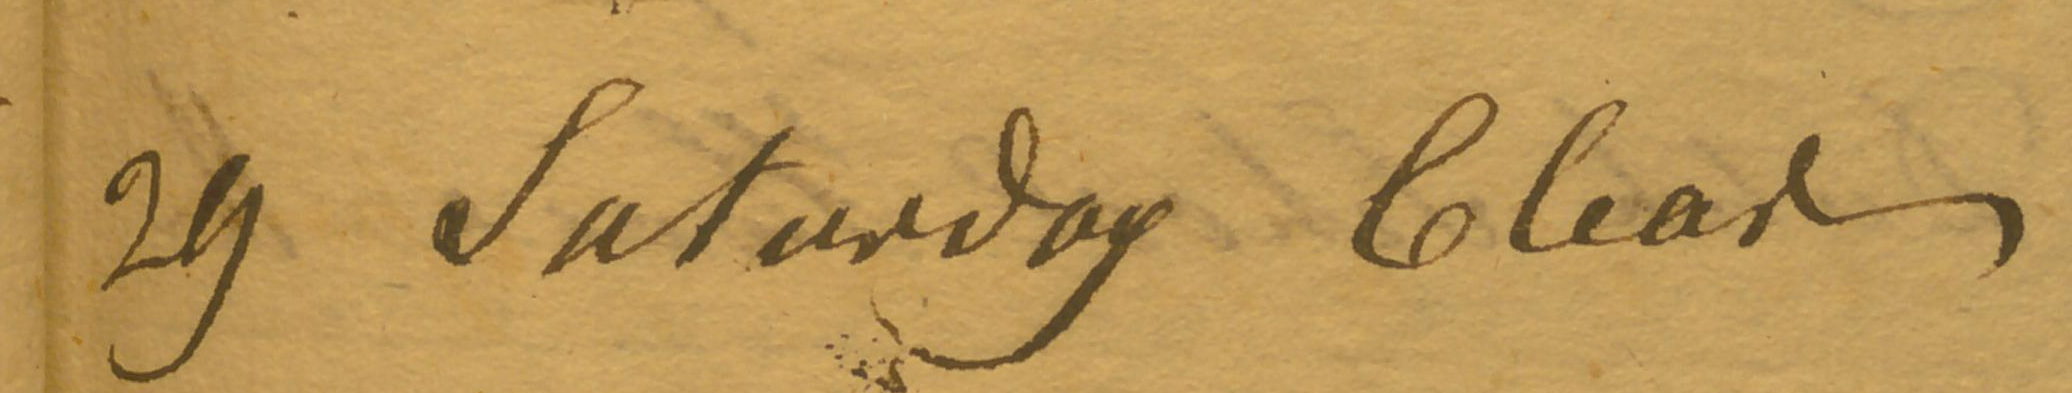29 Saturday Clear
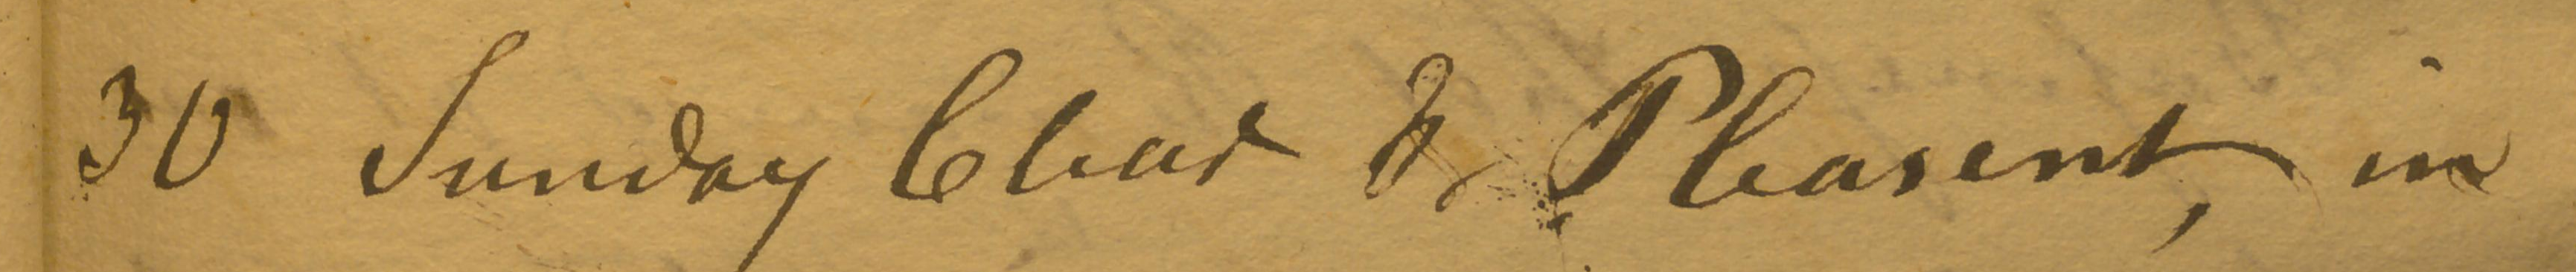30 Sunday Clear & Pleasent in
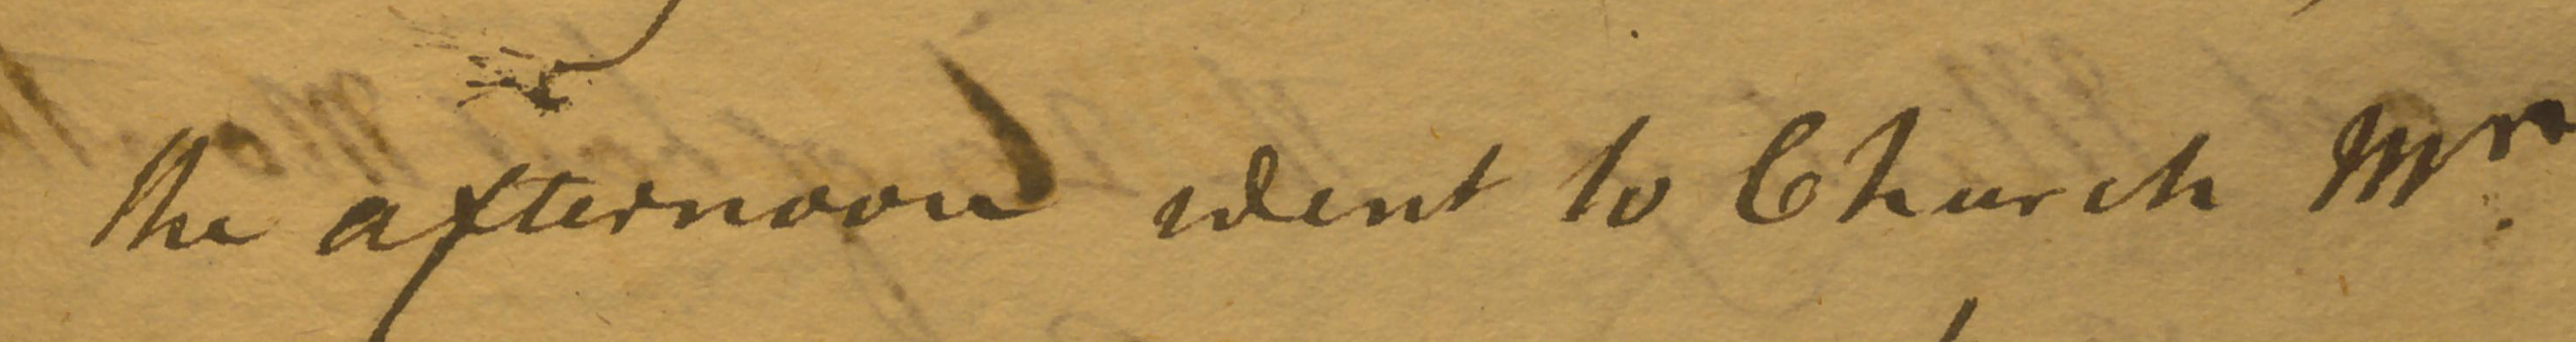the afternoon went to Church M^r.
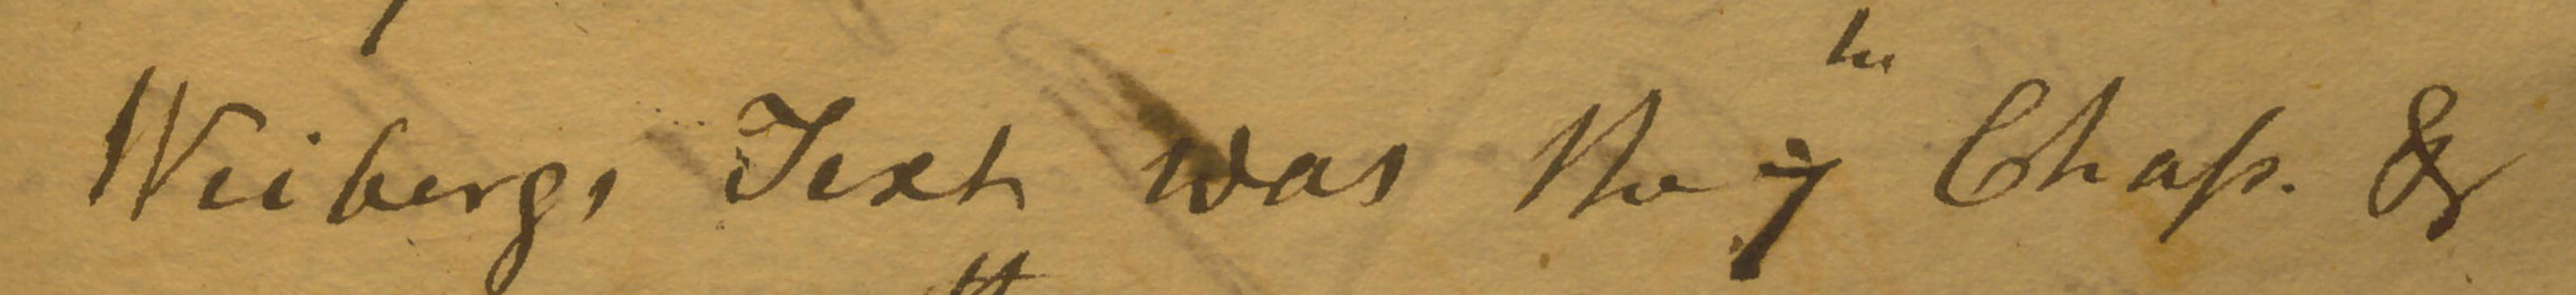Weibergs Text was the 7^th Chap. &
